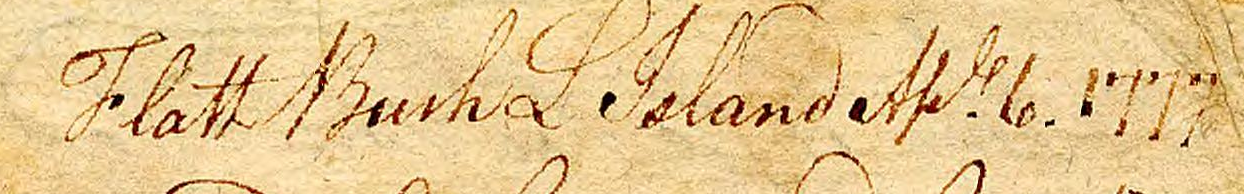Flatt Bush L Island Ap^l. 6. 1777
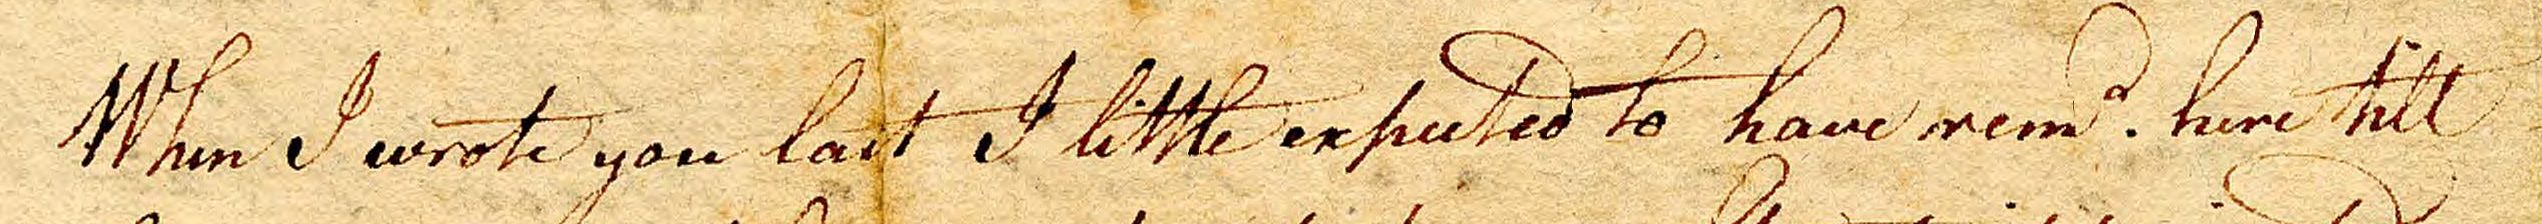When I wrote you last I little expected to have rem^d. here till
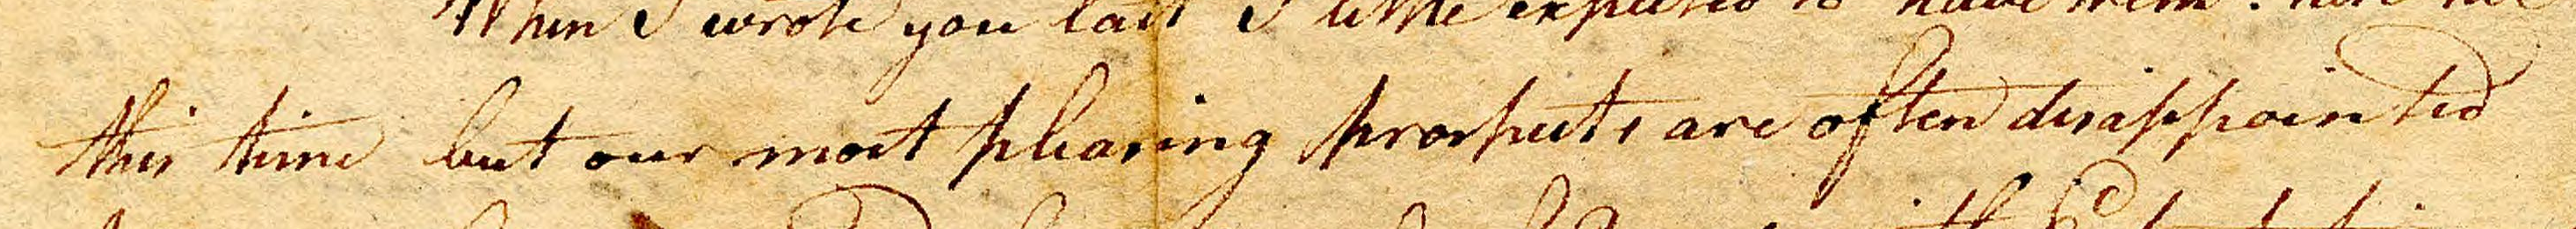this time but our most pleasing prospects are often disappointed
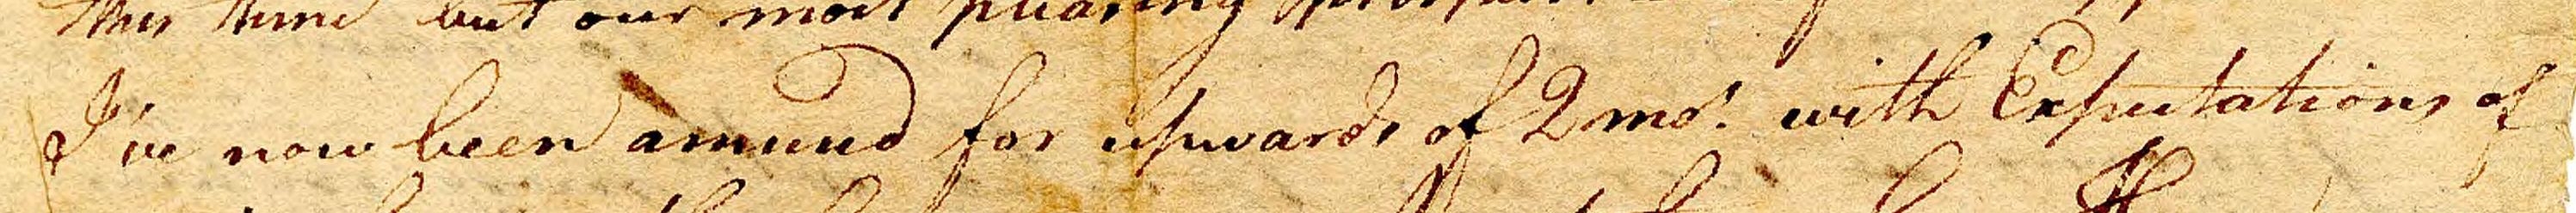I've now been amused for upwards of 2 mo^s. with Expectations of
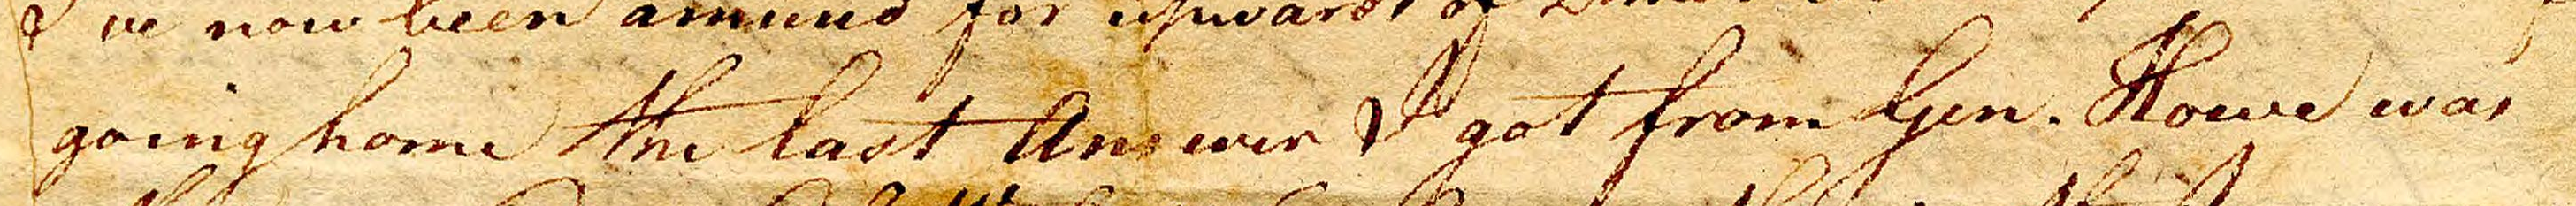going home the last Answer I got from Gen. Howe was
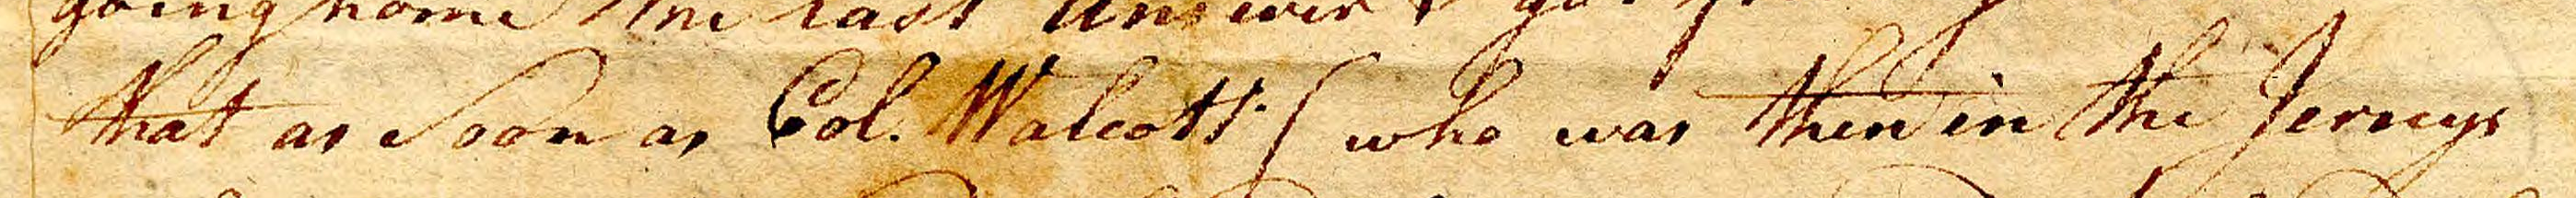that as soon as Col. Walcott (who was then in the Jerseys
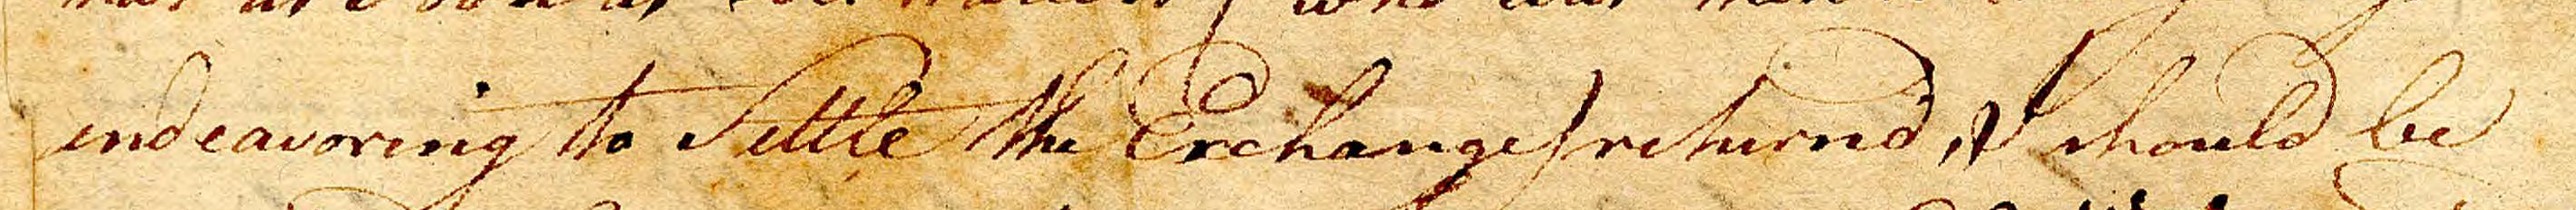endeavoring to Settle the Exchange) return'd, I should be
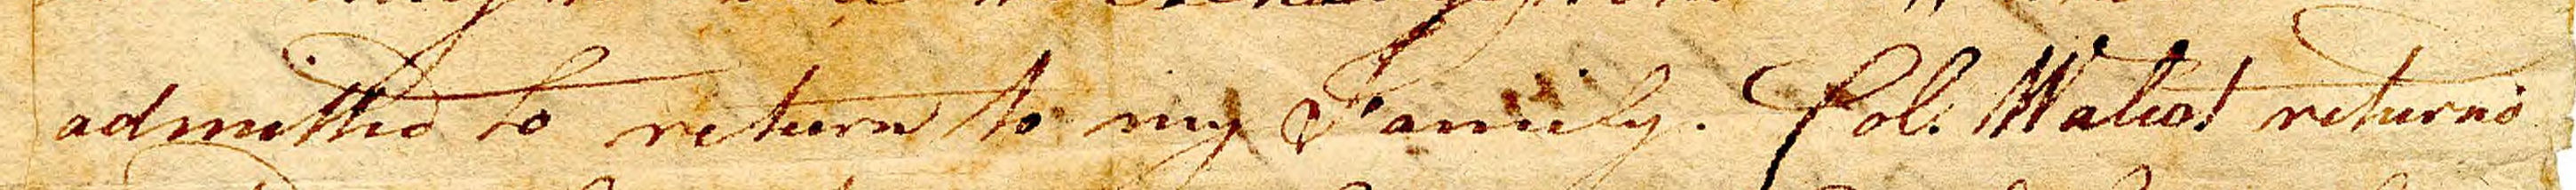admitted to return to my Family. Col. Walcot return'd
